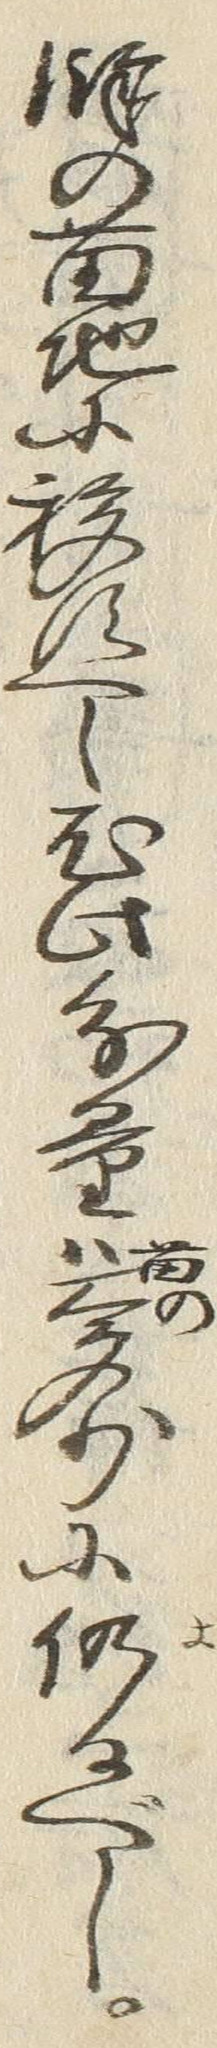餘の苗地尓移須へし尤此分量は苗の多少尓仍るべし。
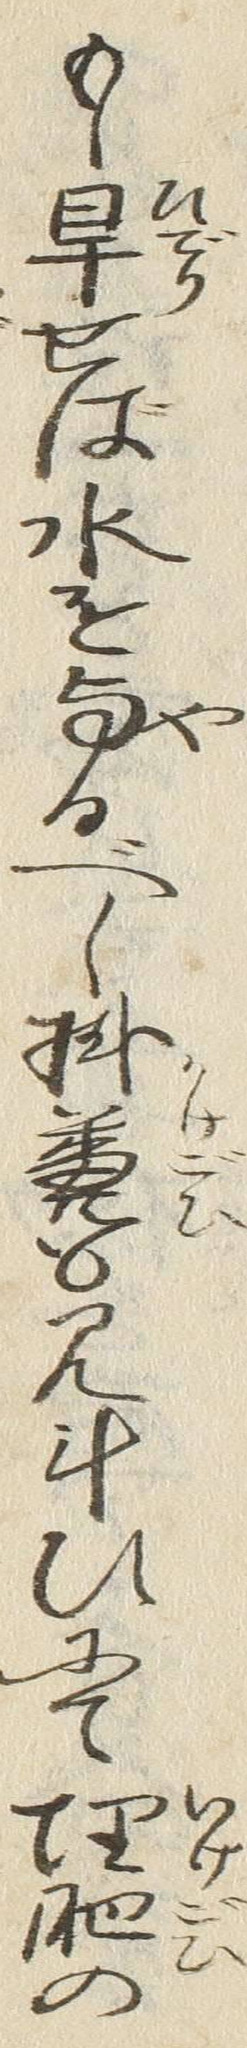もし旱せば水を与るべし掛糞も見斗ひ尓て埋肥の
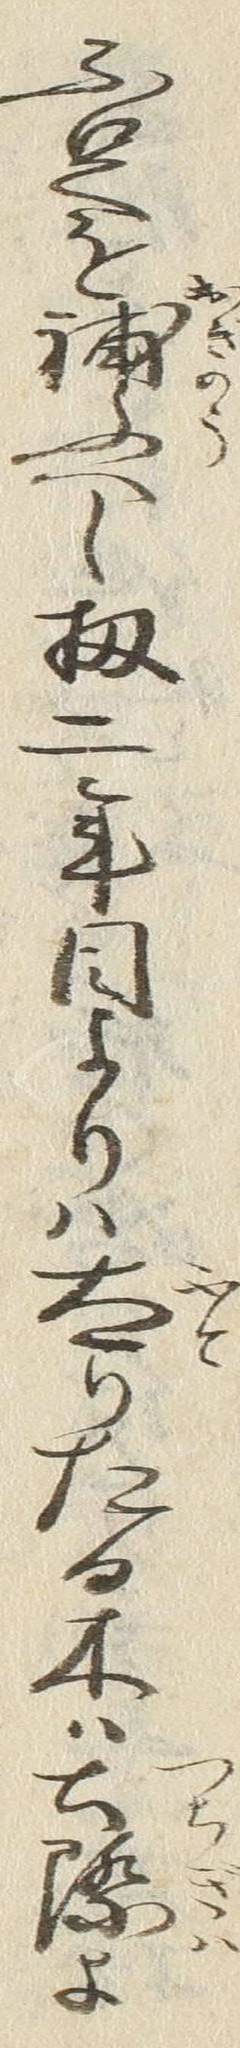ふ足を補ふへし扨二年目よりは太りたる木は土際よ
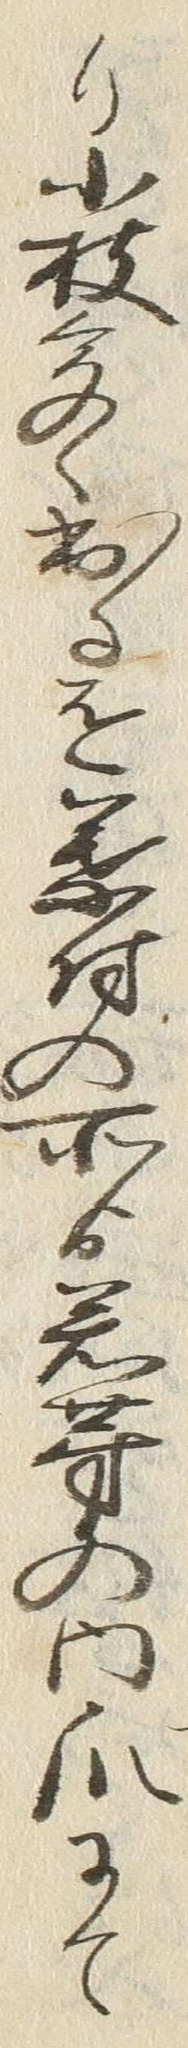り小枝多く出るを葉付の所ゟ若芽の内爪尓て
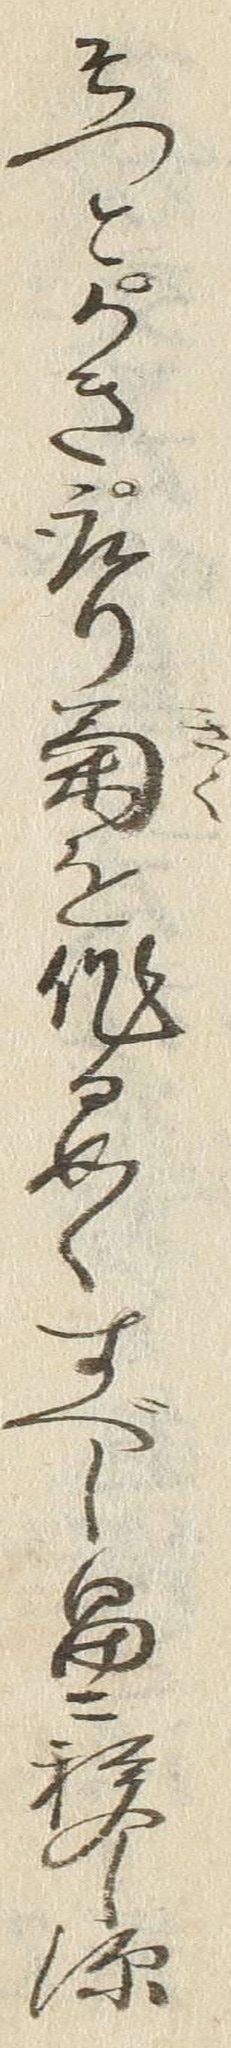そつと。かき。取り菊を作る如くすべし畠に移し深
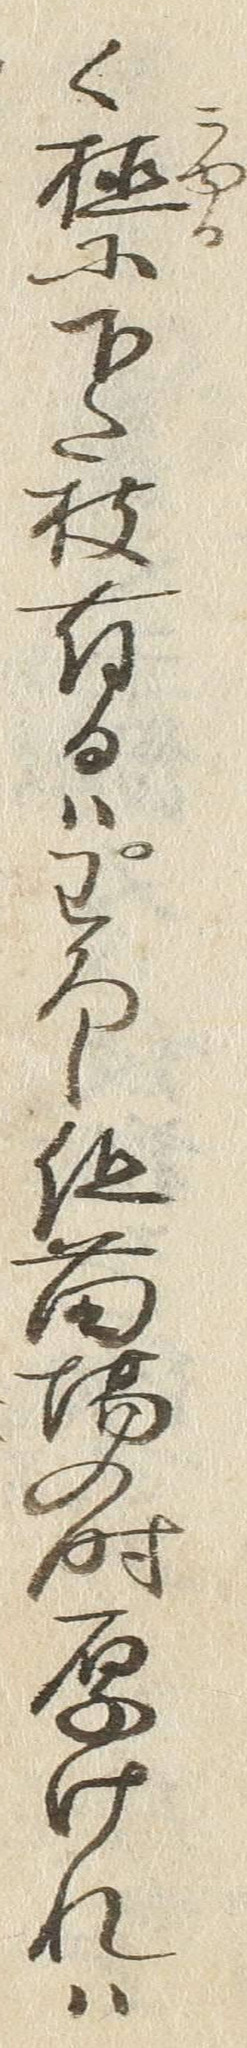く植尓下た枝有るは。わろし但苗場の時厚けれは
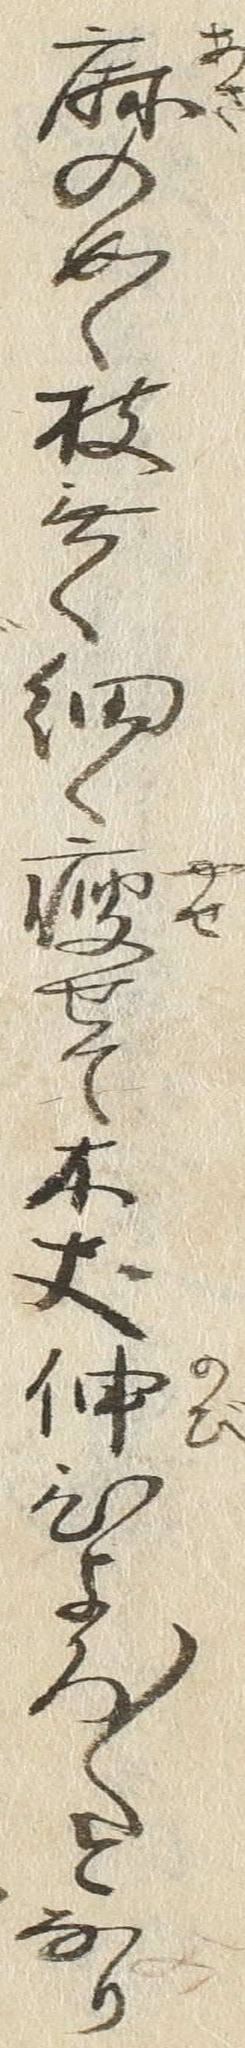麻の如く枝無く細く痩せて木丈伸飛よろ〳〵となり
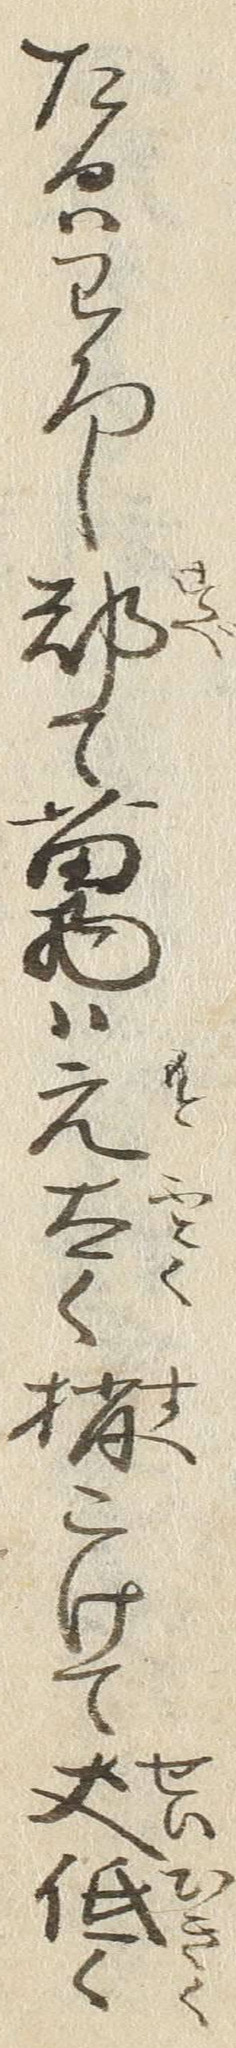たるはわろし都て苗物は元太く梢こけて丈低く
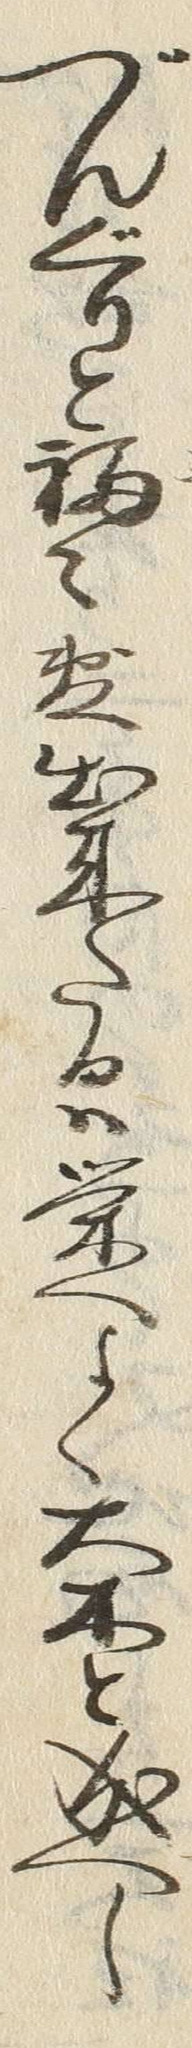づんぐりと福々敷出来たるは栄へよく大木と成べし
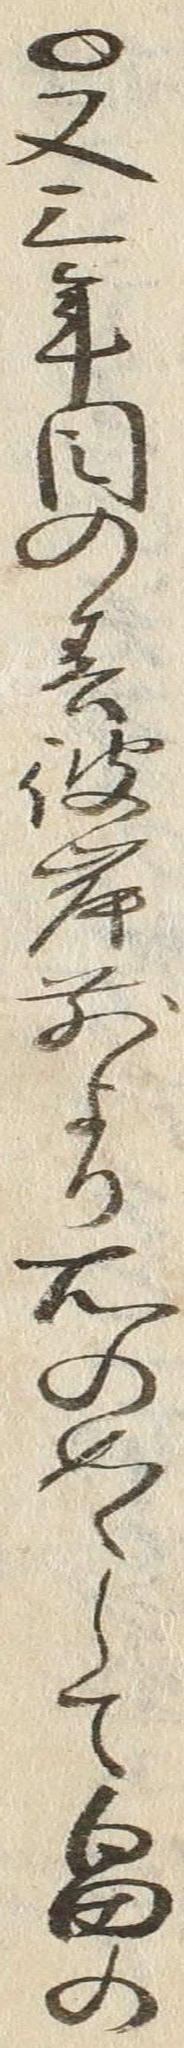〇又三年目の春彼岸前より右の如くして畠の
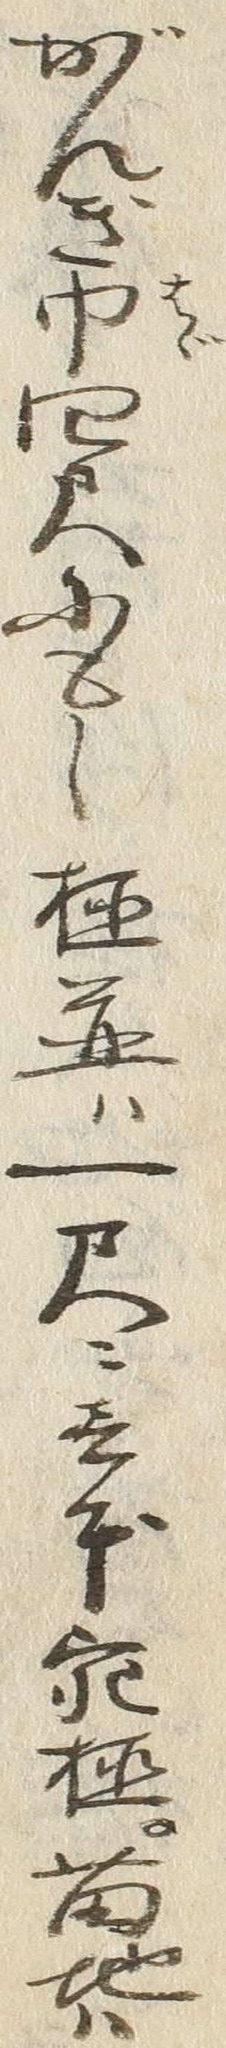がんぎ巾四尺二もし植並は一尺に壱本宛植。苗地は
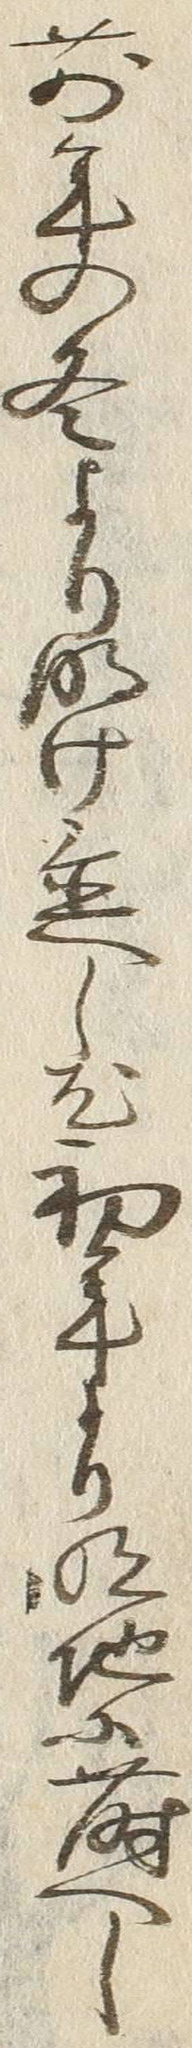前年の冬より明け置へし尤初年より明地に蒔へし
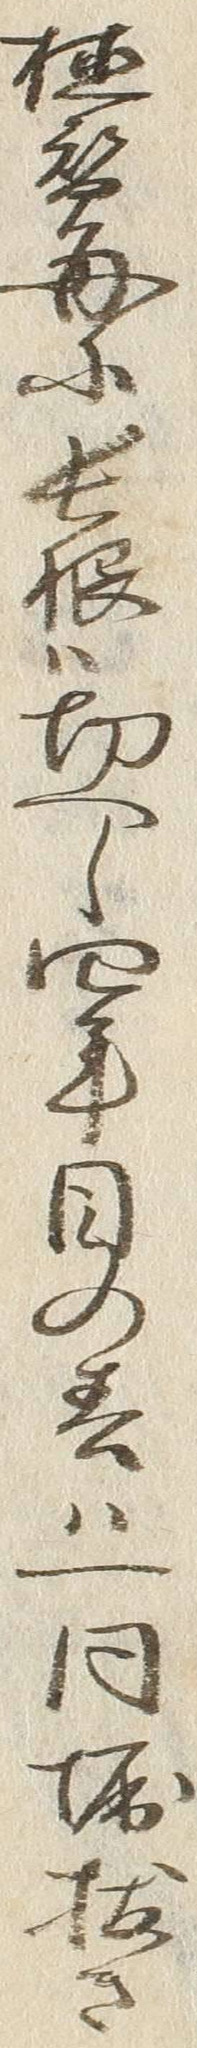植替毎尓長根は切へし四年目の春は一同堀抜き
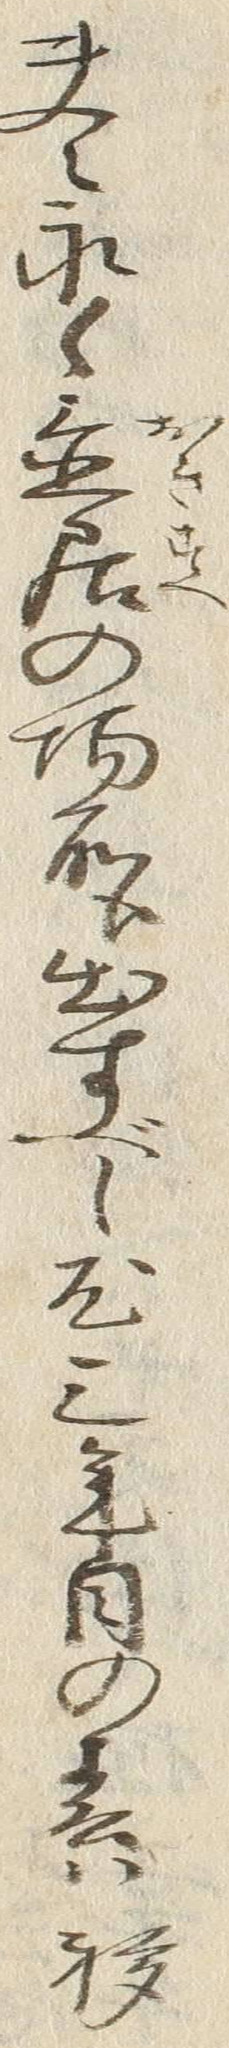夫々永く置居の場所江出すべし尤三年目の春は移
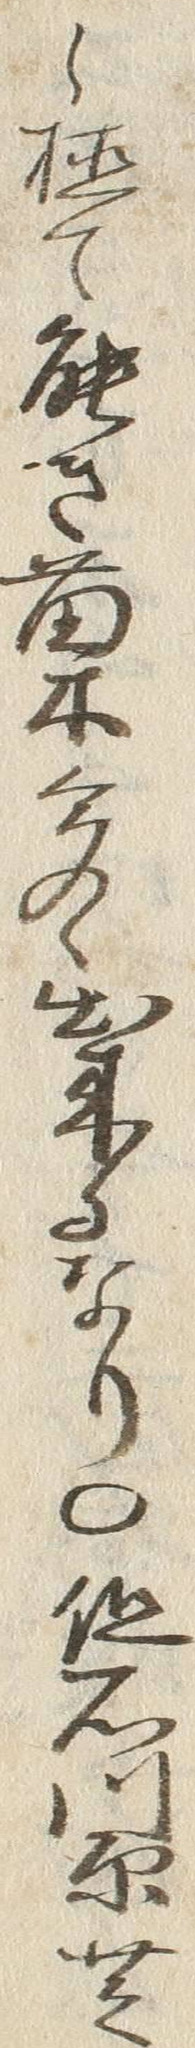し植て能き苗木多く出来るなり〇但石川原芝
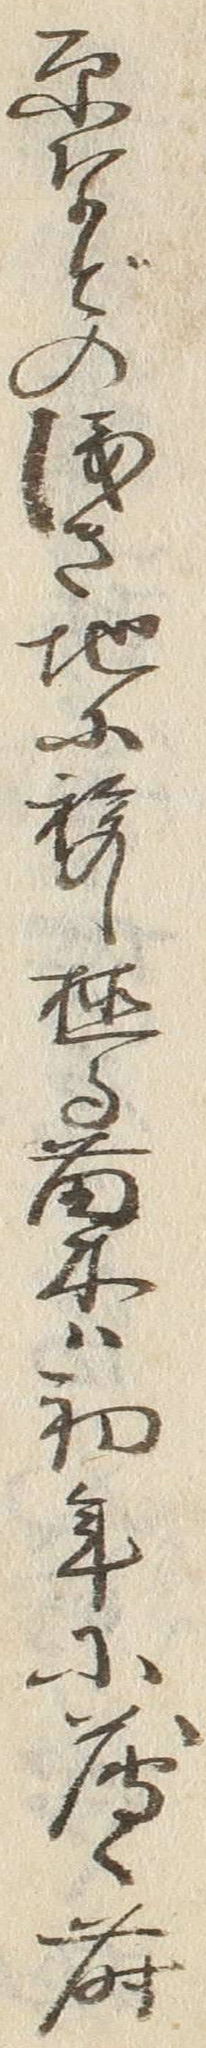原などの浅き地に移し植る苗木は初年尓薄く蒔
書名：養蠶實驗録後編
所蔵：東京大学農学生命科学図書館 国文学研究資料館
